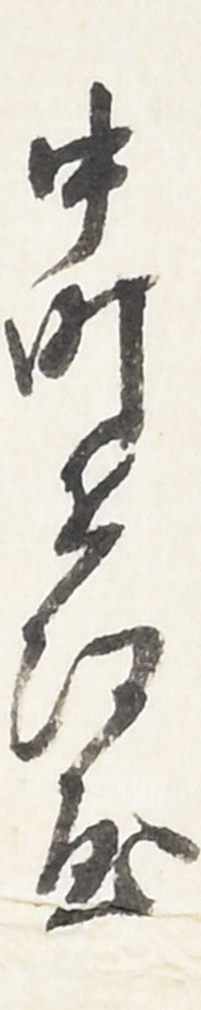中町近江屋
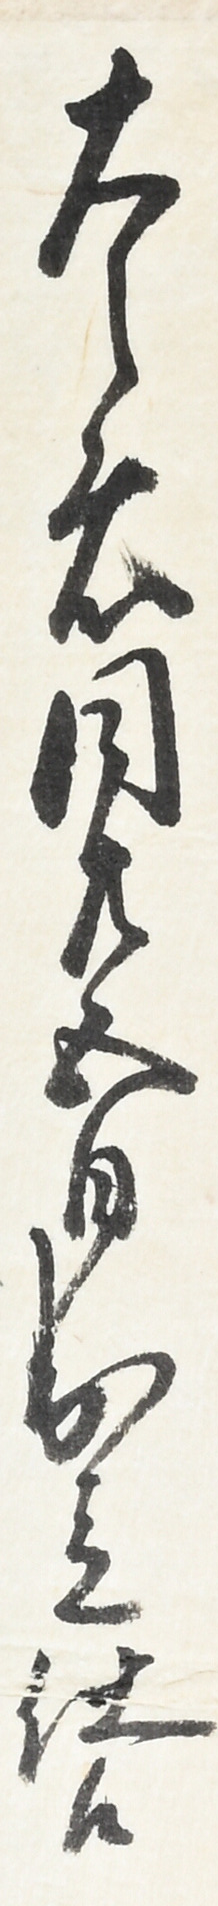右之者同廿五日出立仕候
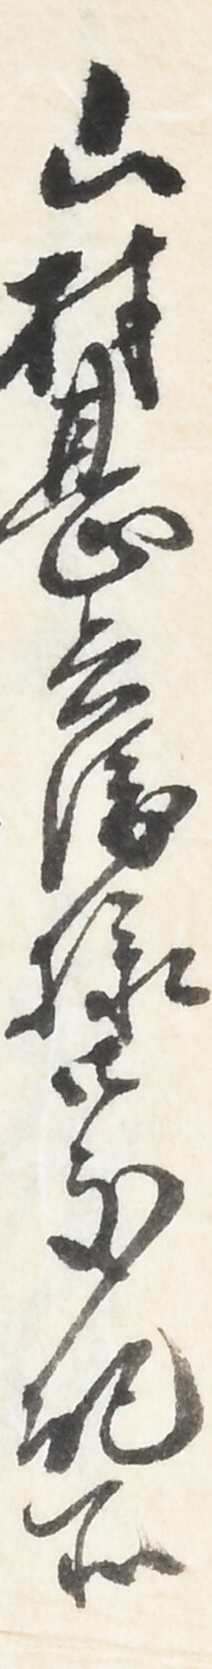山村甚兵衛様御支配所
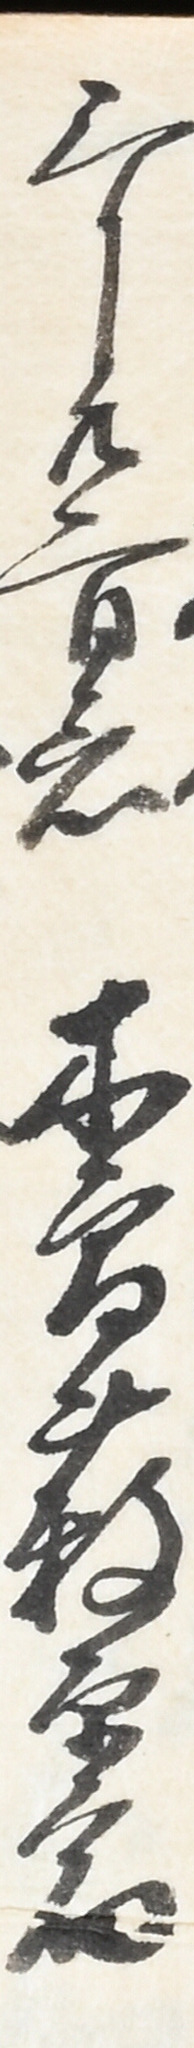参月廿一日着木曽上松宿

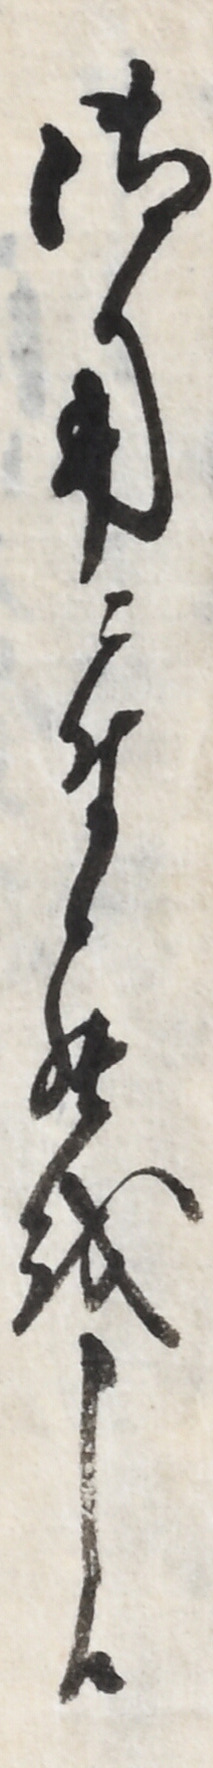御用ニ付罷越申候
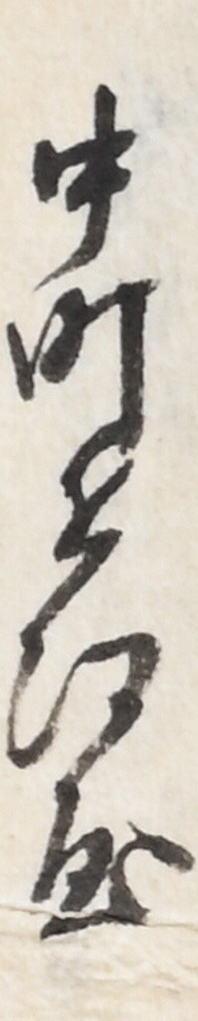中町近江屋
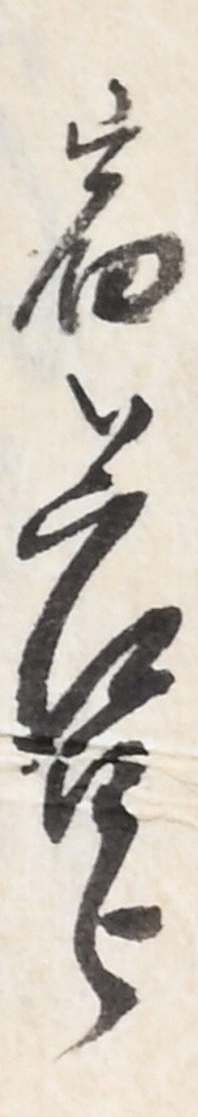原兵右衛門
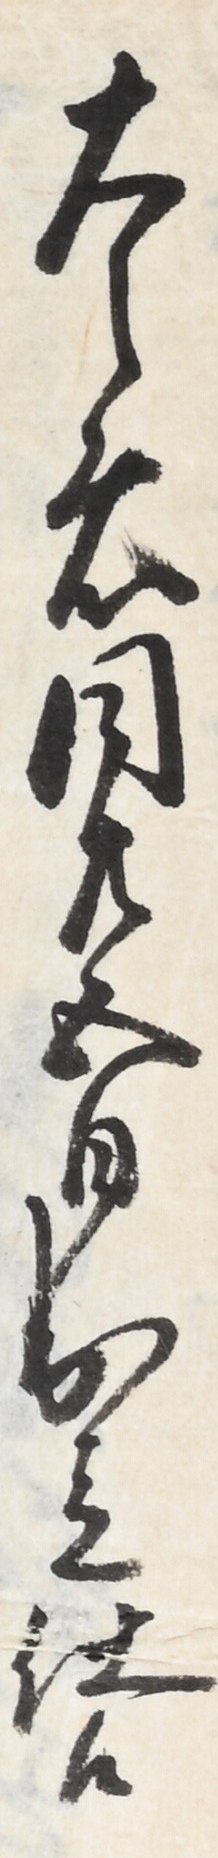右之者同廿五日出立仕候
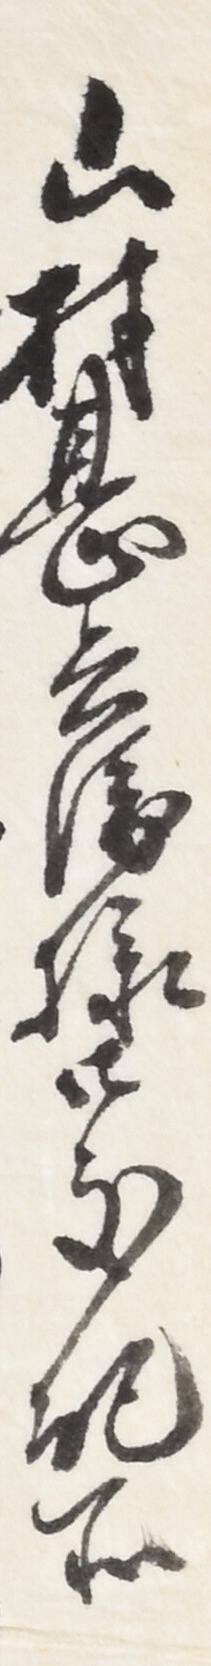山村甚兵衛様御支配所
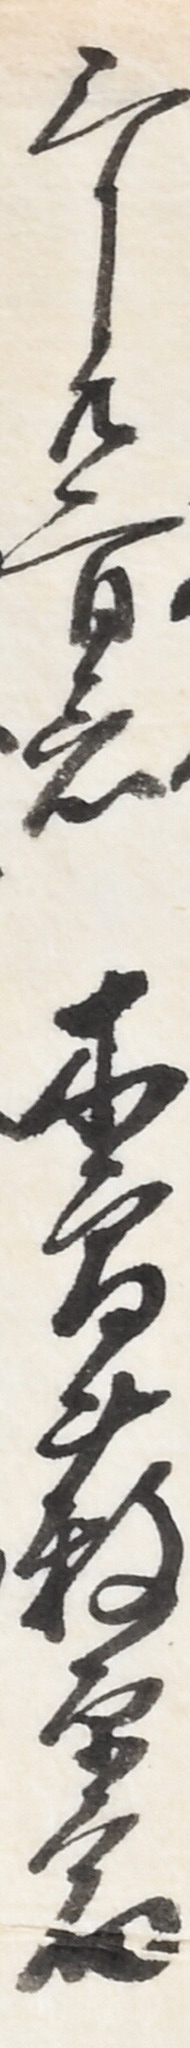三月廿日着木曽藪原宿
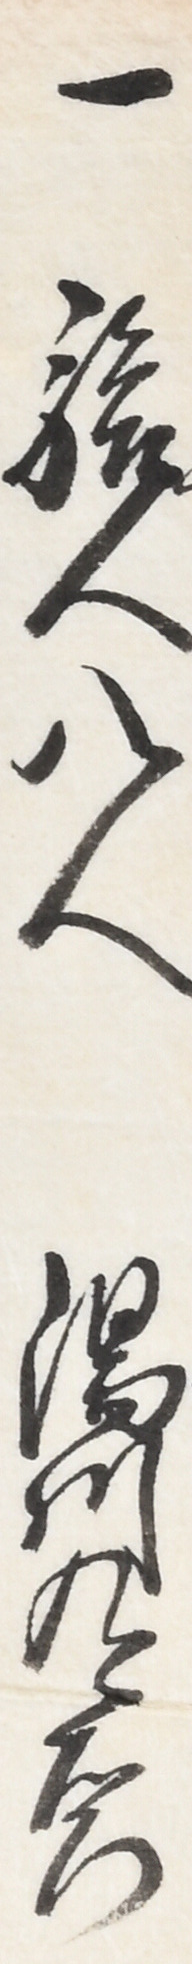一旅人八人湯川九郎右衛門
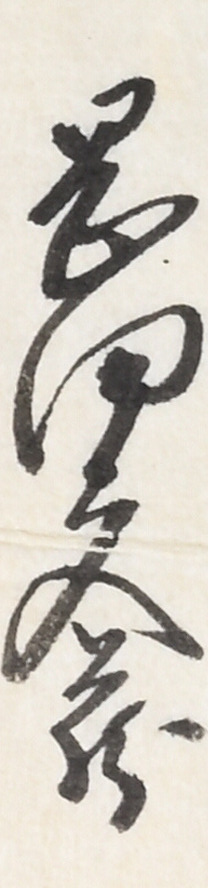岡田文蔵
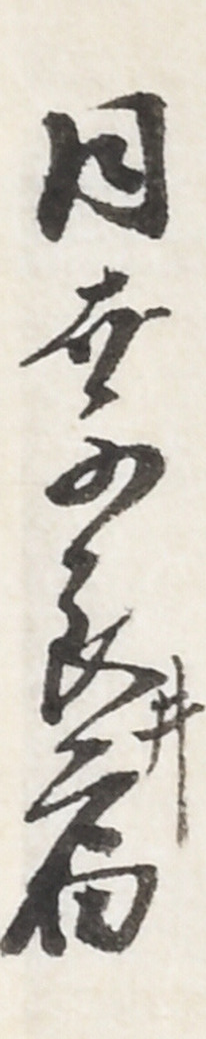同奈良宿
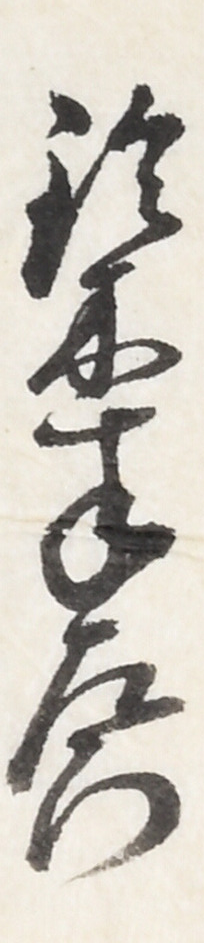鈴木半左衛門
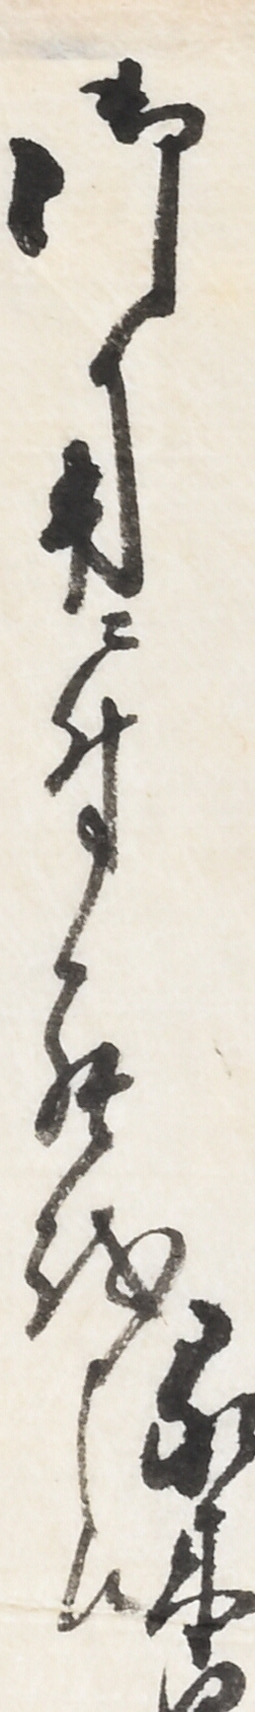御用ニ付罷越申候
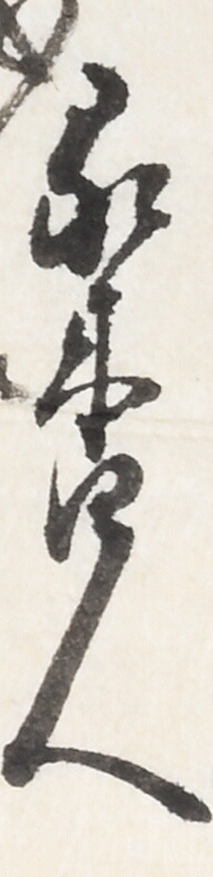家来四人
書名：旅人泊控帳
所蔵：伊那市立高遠町図書館・合同会社AMANE
